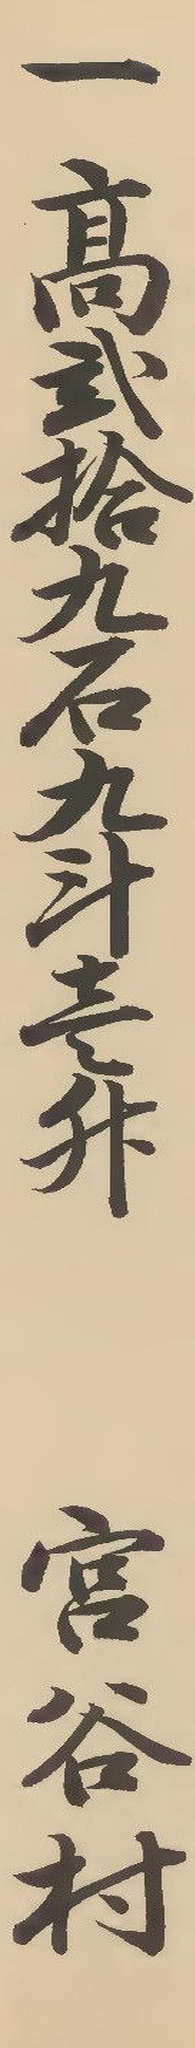一高弐拾九石九斗壱升宮谷村
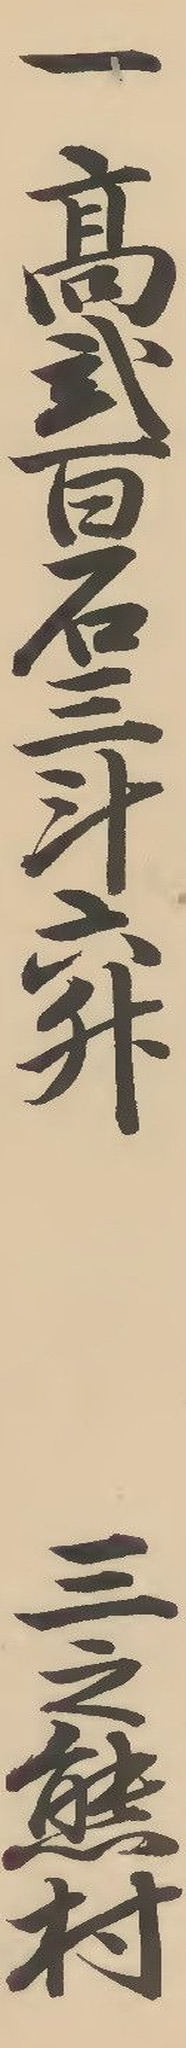一高弐百石三斗六升三之熊村

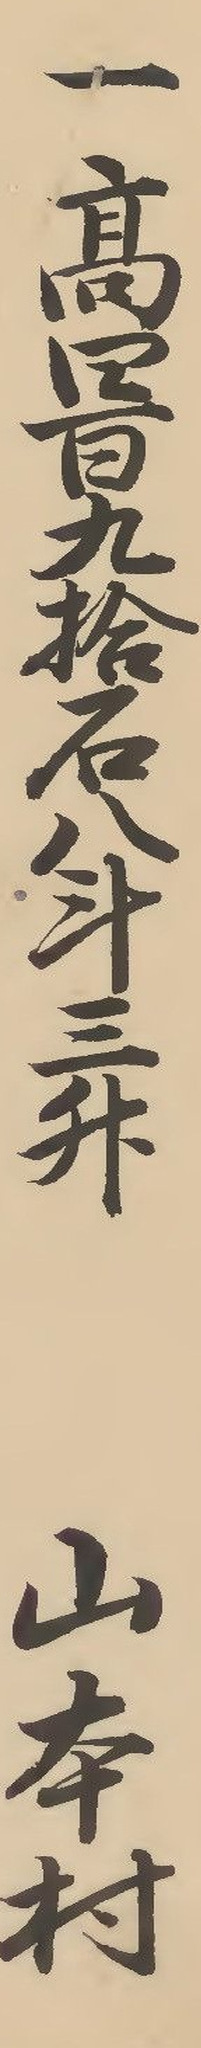一高四百九拾石八斗三升山本村
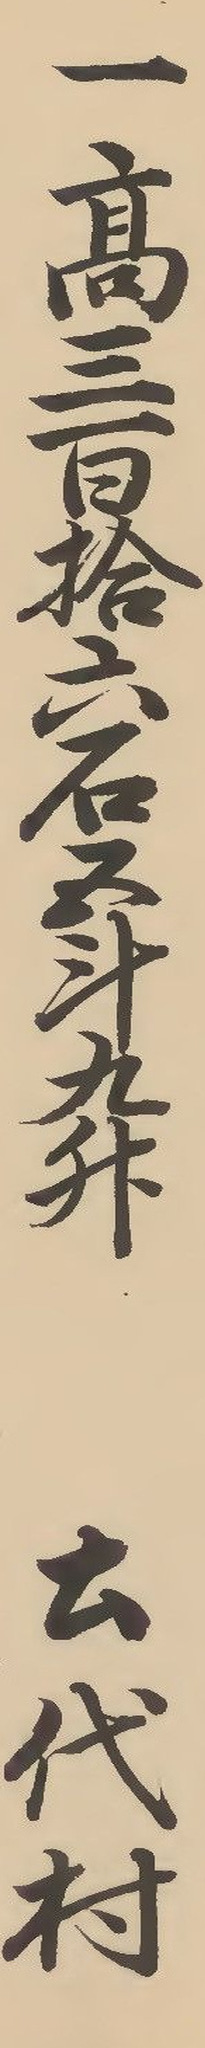一高三百拾六石五斗九升土代村
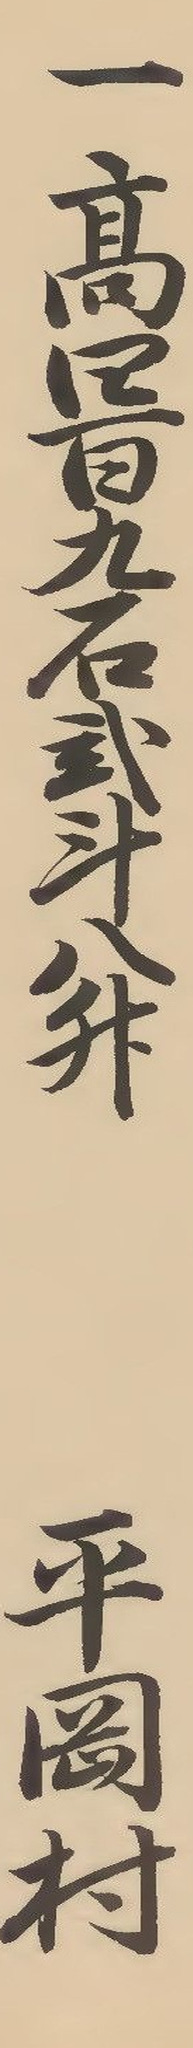一高四百九石弐斗八升平岡村
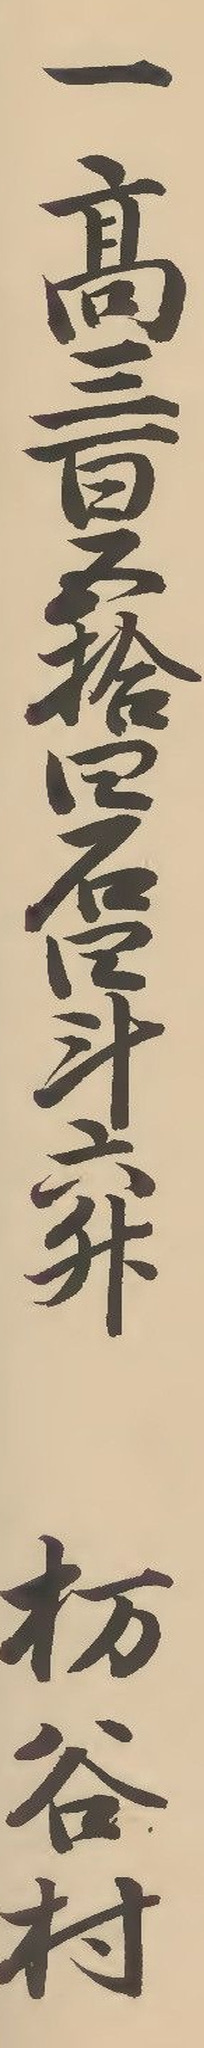一高三百五拾四石四斗六升栃谷村
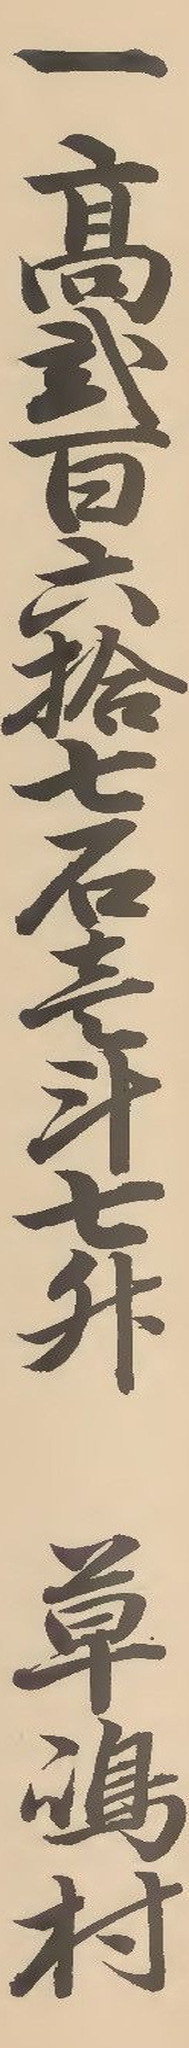一高弐百六拾七石壱斗七升草島村
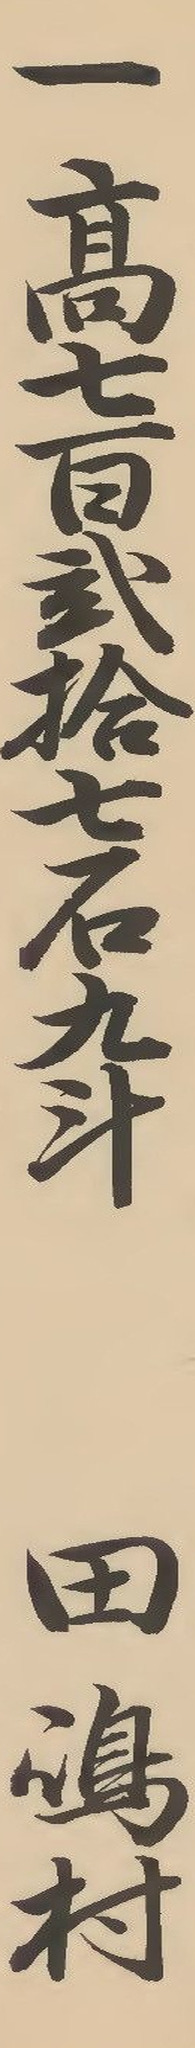一高七百弐拾七石九斗田島村
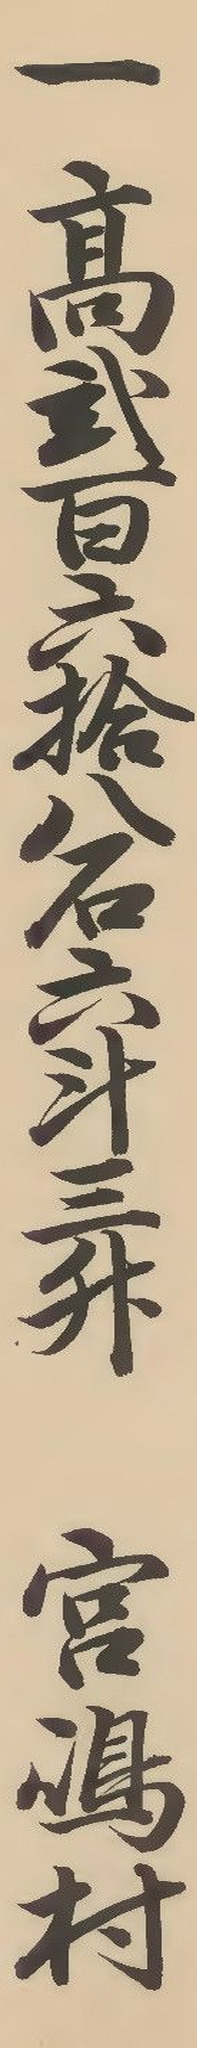一高弐百六拾八石六斗三升宮島村
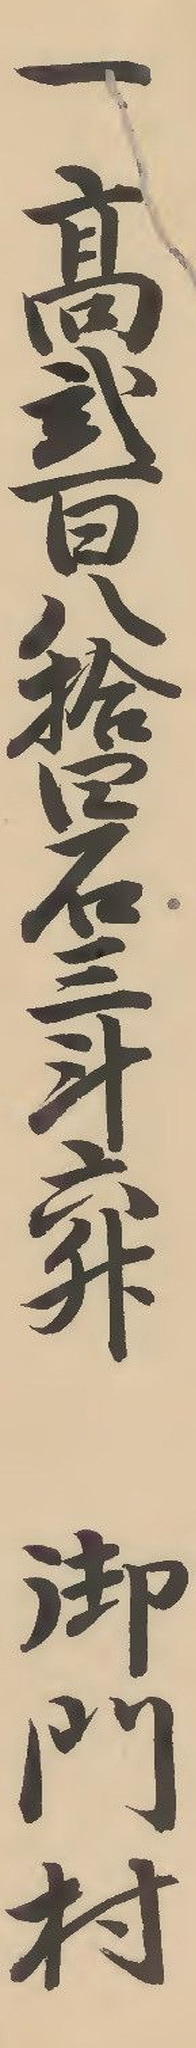一高弐百八拾四石三斗六升御門村

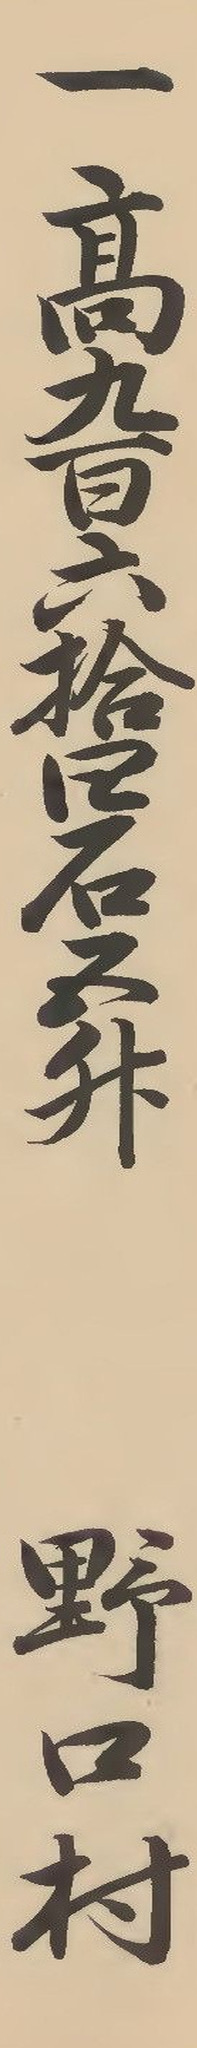一高九百六拾四石五升野口村
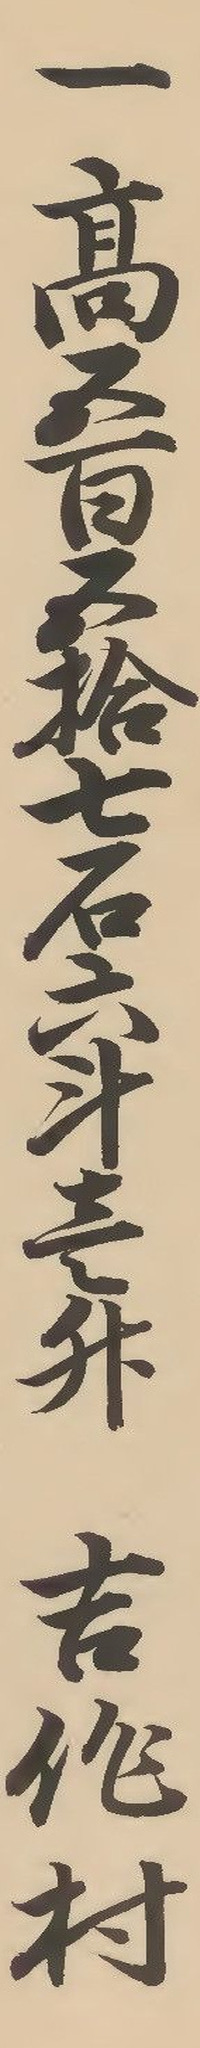一高五百五拾七石六斗壱升吉作村
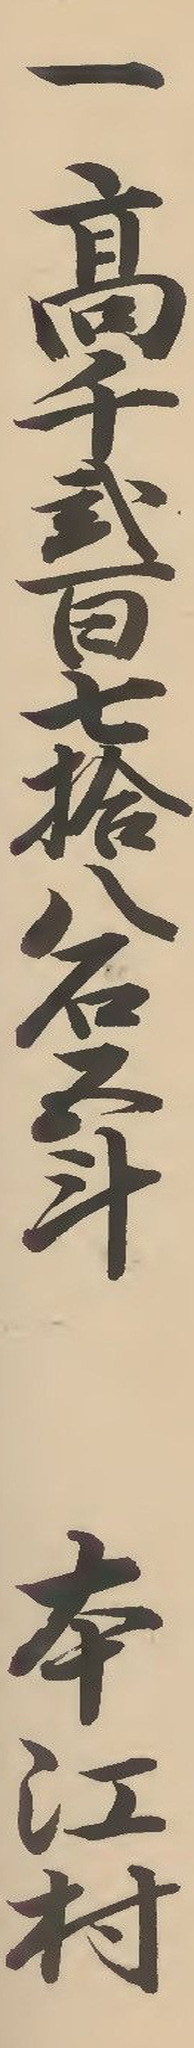一高千弐百七拾八石五斗本江村
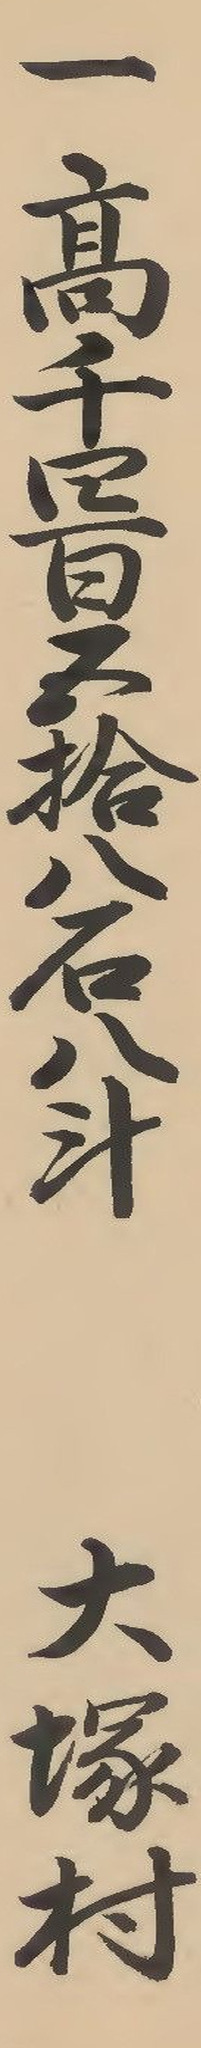一高千四百五拾八石八斗大塚村
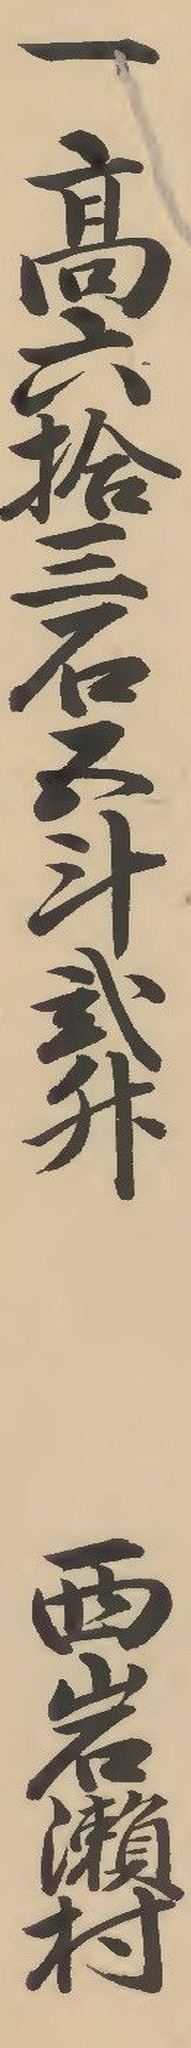一高六拾三石五斗弐升西岩瀬村

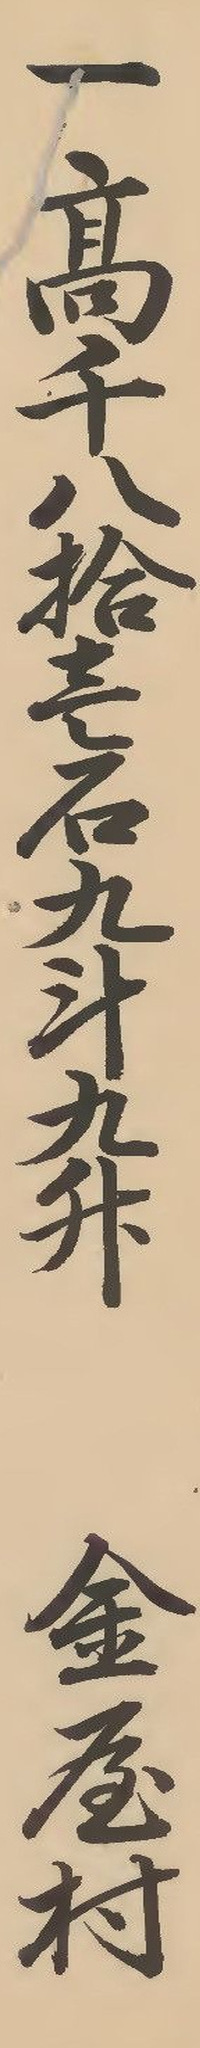一高千八拾壱石九斗九升金屋村
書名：越中国郷帳
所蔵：国立公文書館 National Archives of Japan
